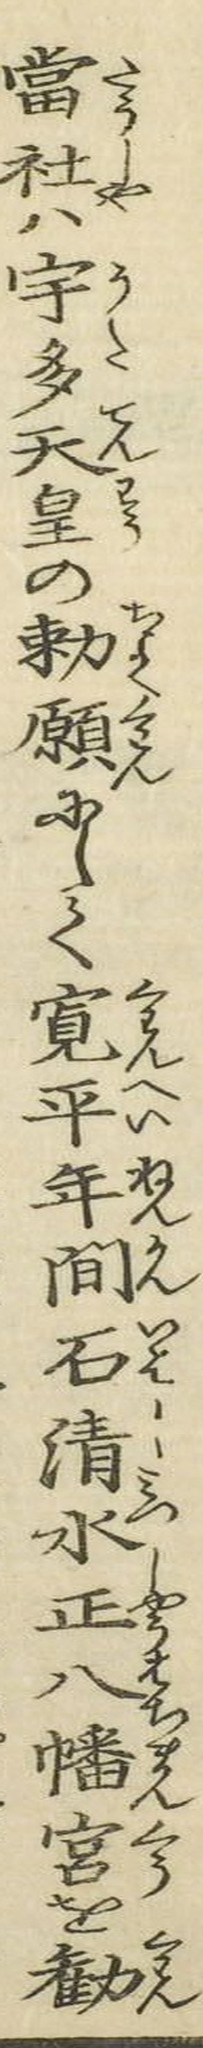当社は宇多天皇の勅願にして寛平年間石清水正八幡宮を勧
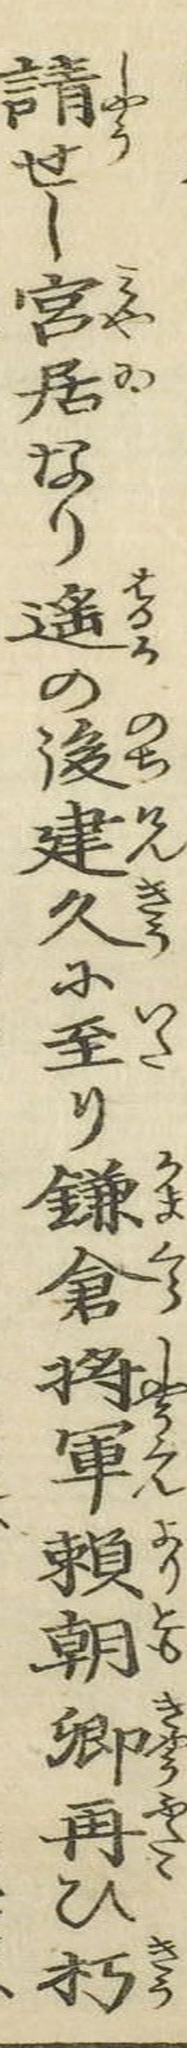請せし宮居なり遥の後建久に至り鎌倉将軍頼朝卿再ひ朽
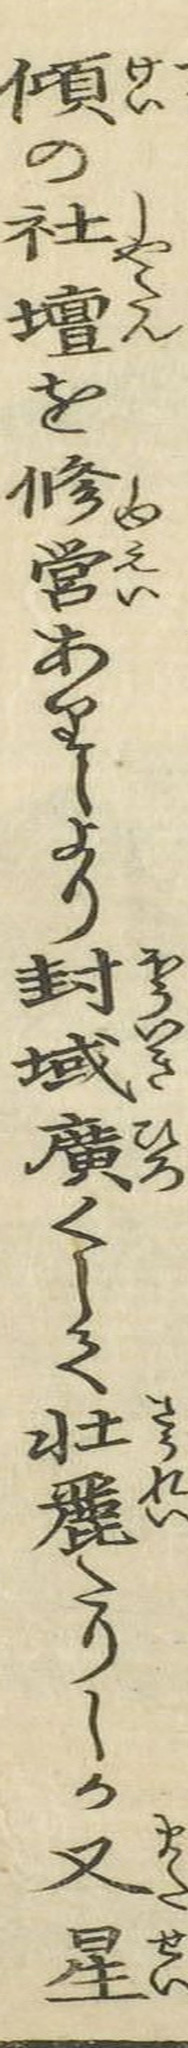傾の社壇を修営ありしより封域広くして壮麗たりしか又星
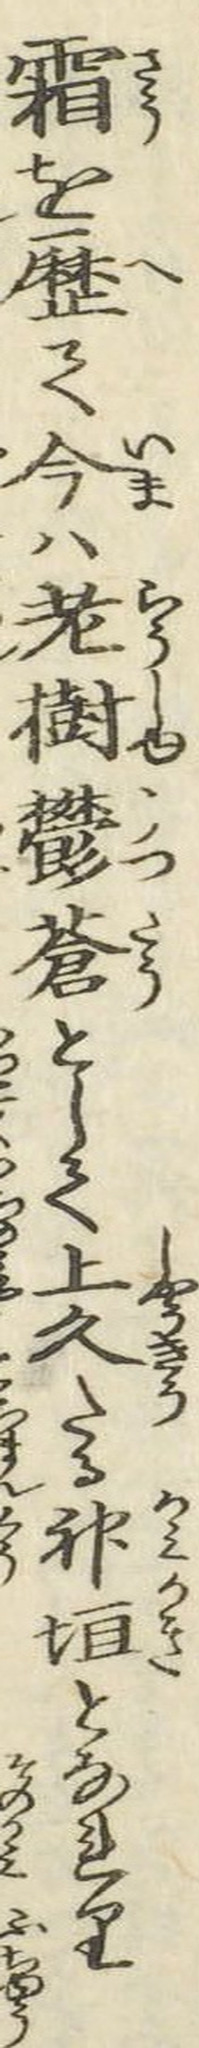霜を歴て今は老樹鬱蒼として上久たる神垣となれり
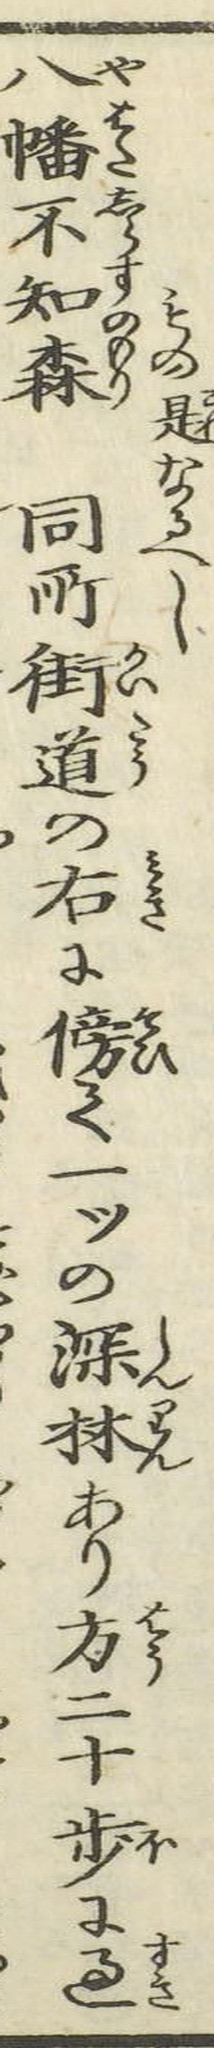八幡不知森同所街道の右に傍て一つの深森あり方二十歩に過
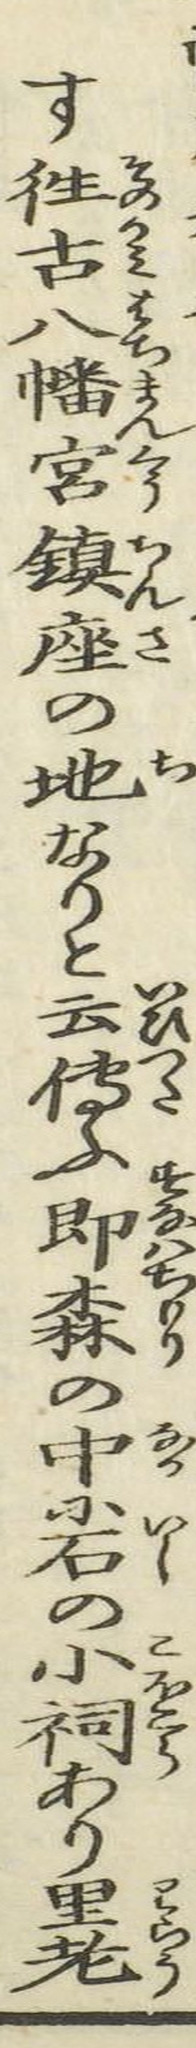す往古八幡宮鎮座の地なりと云伝ふ即森の中に石の小祠あり里老
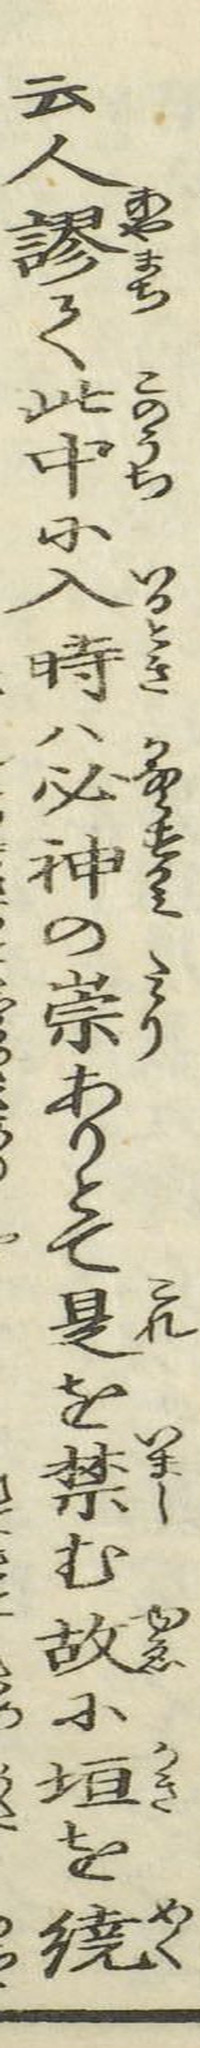云人謬て此中に入時は必神の祟ありとて是を禁む故に垣を繞
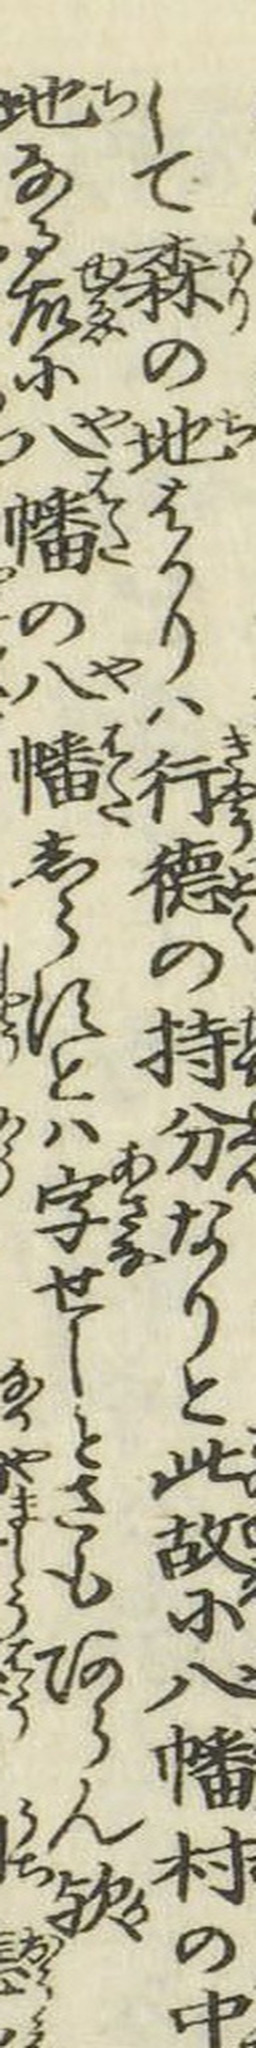地なる故に八幡の八幡しらすとは字せしとさもあらん歟
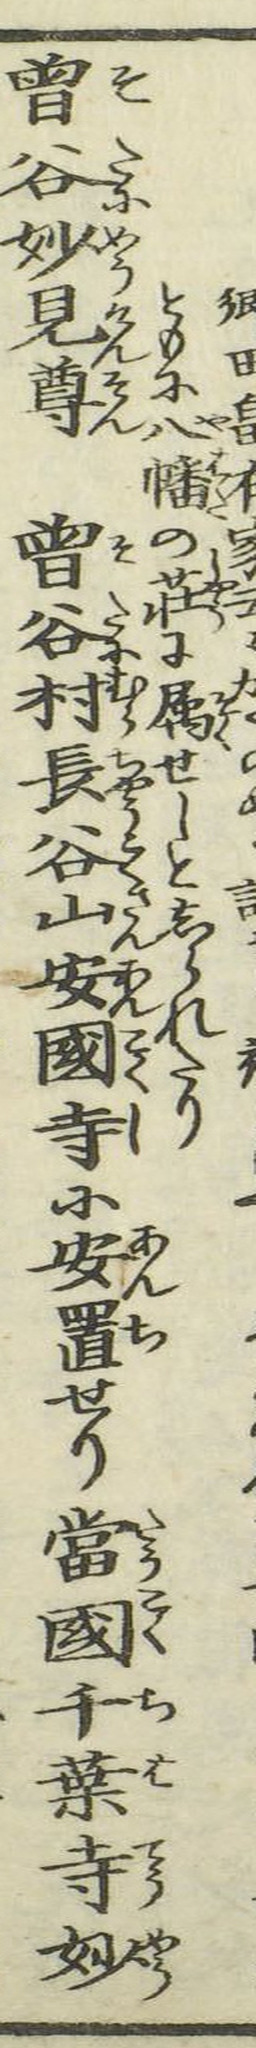曽谷妙見尊曽谷村長谷山安国寺に安置せり当国千葉寺妙
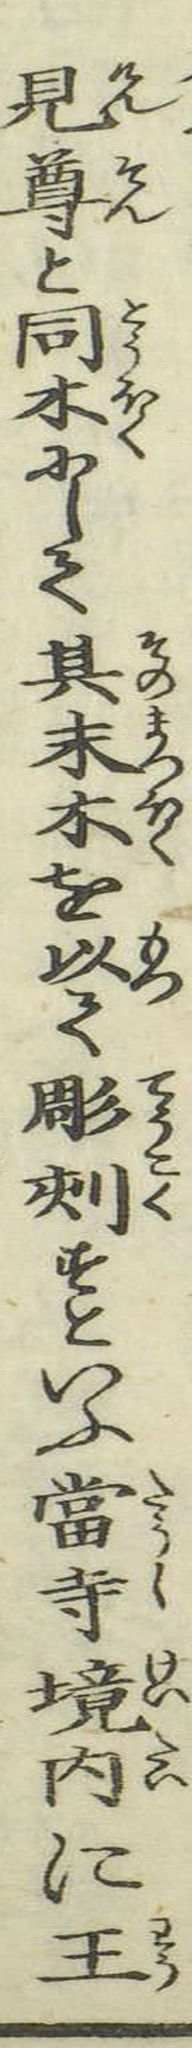見尊と同木にして其末木を以て彫刻すといふ当寺境内に王
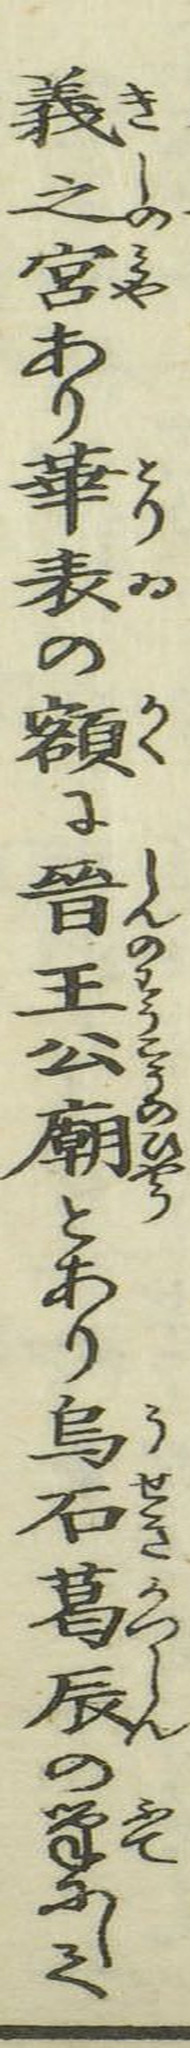義之宮あり華表の額に晋王公廟とあり烏石葛辰の筆にして
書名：江戸名所図会 20巻 巻之20
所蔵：東京学芸大学教育コンテンツアーカイブ
